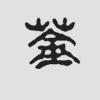{荼土}
